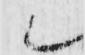乙
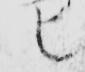巳
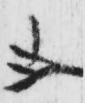之
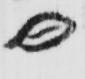日
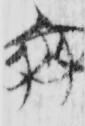秦
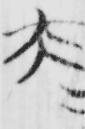大夫
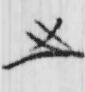之
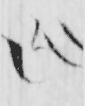州
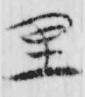里
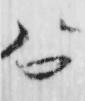公
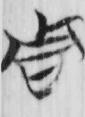周
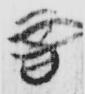言
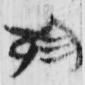於
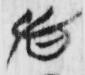左
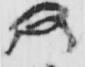尹
